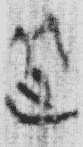從
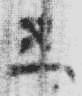之
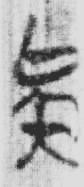矣
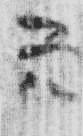亓（其）
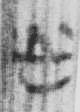心
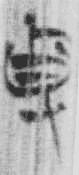弁（變）
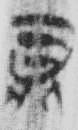鼎（則）
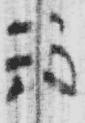亓（其）
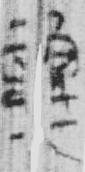聖（聲）
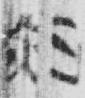亦
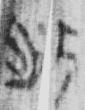肰（然）
